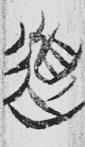道
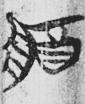𨟻
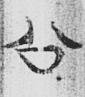公
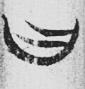曰
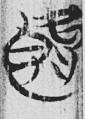既
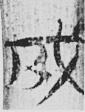成
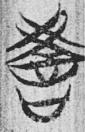○（教）
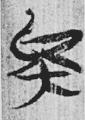矣
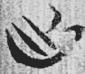出
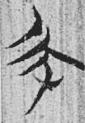帀（師）
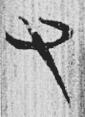又（有）
